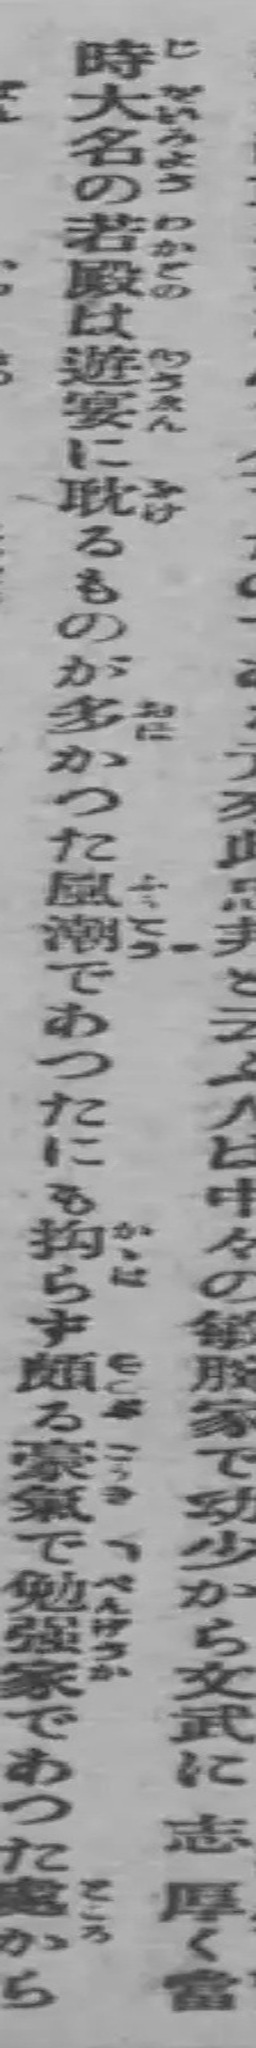時大名の若殿は遊宴に耽るものが多かつた風潮であつたにも拘らず頗る豪気で勉強家であつた処から
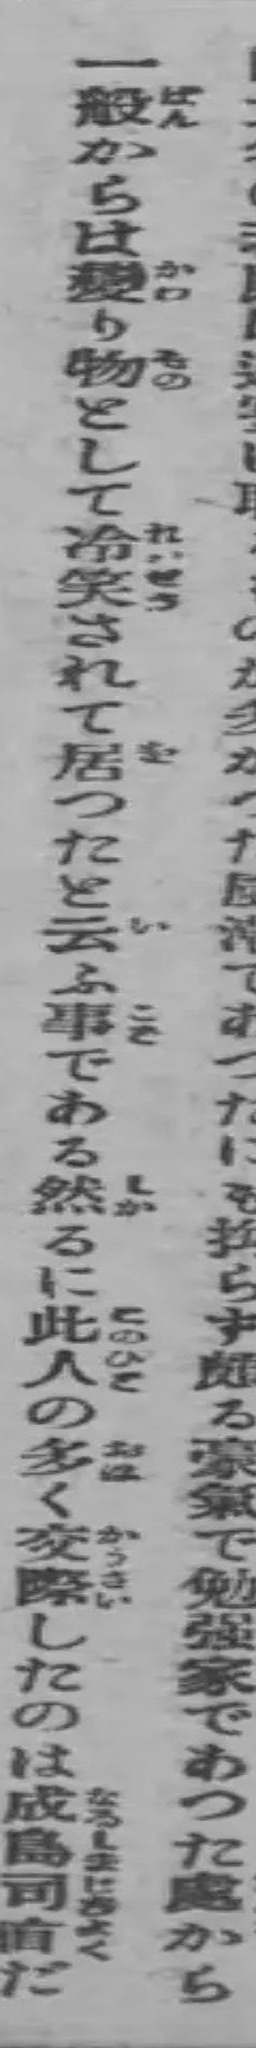一般からは変り物として冷笑されて居つたと云ふ事である然るに此人の多く交際したのは成島司直だ
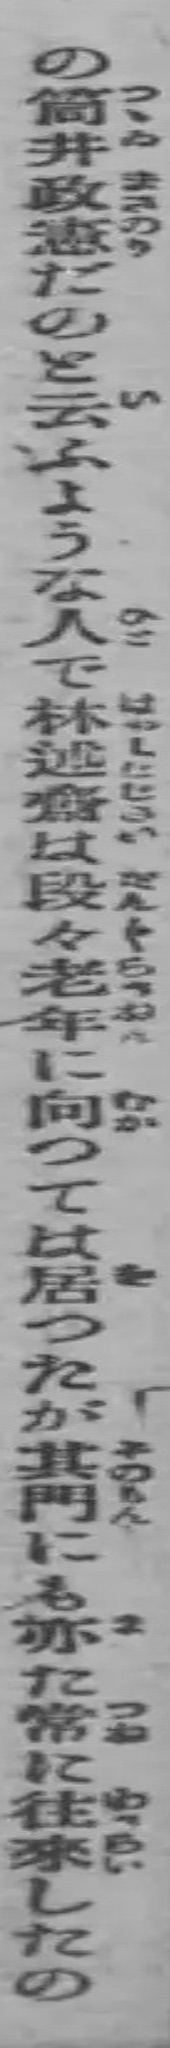の筒井政憲だのと云ふような人で林述斉は段々老年に向つては居つたが其門にも亦た常に往来したの
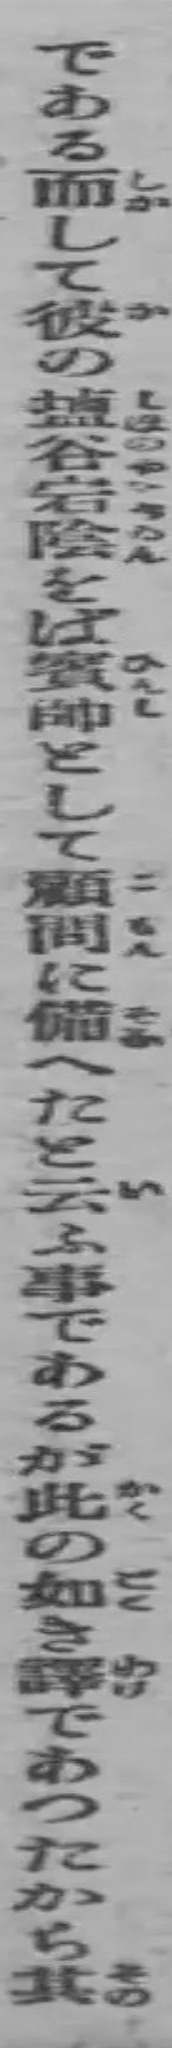である而して彼の塩谷宕陰をば賓師として顧問に備へたと云ふ事である此の如き訳であつたから其
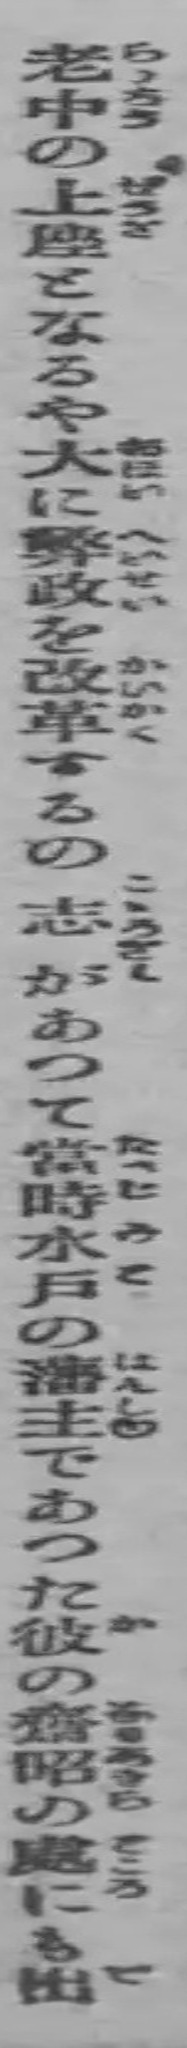老中の上座となるや大に弊政を改革するの志があつて当時水戸の藩主であつた彼の斉昭の処にも出
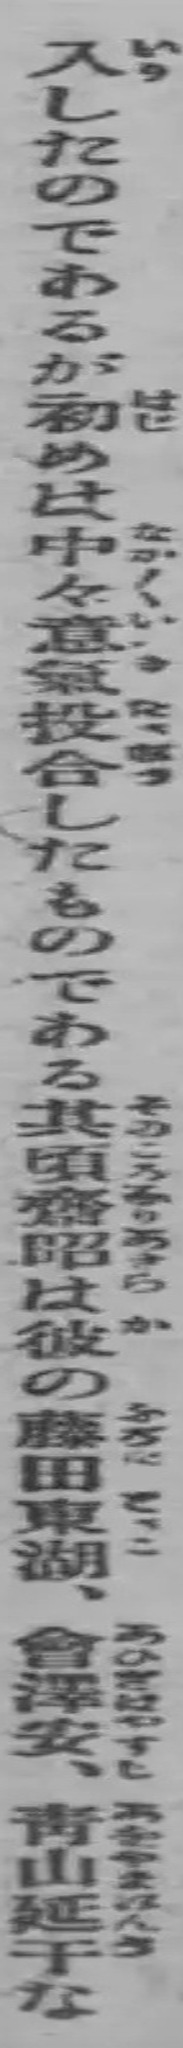入したのであるが初めは中々意気投合したものである其頃斉昭は彼の藤田東湖、会沢安、青山延于な
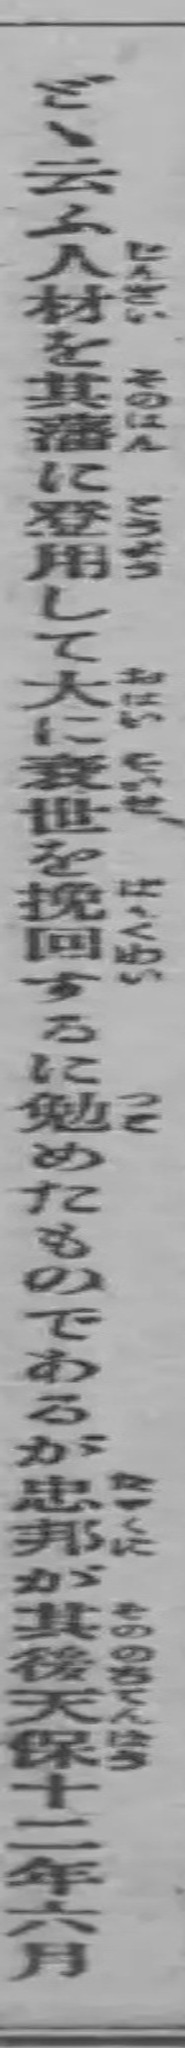どゝ云ふ人材を其藩に登用して大に衰世を挽回するに勉めたものであるが忠邦が其後天保十二年六月
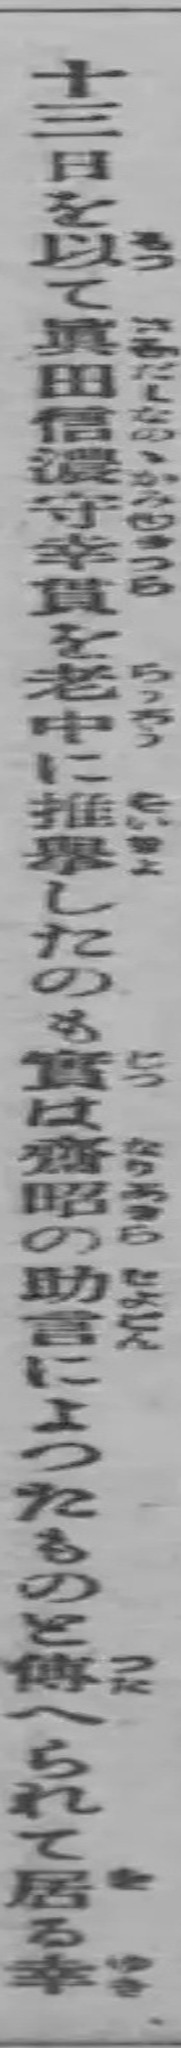十三日を以て真田信濃守幸貫を老中に推挙したのも実は斉昭の助言によつたものと伝へられて居る幸
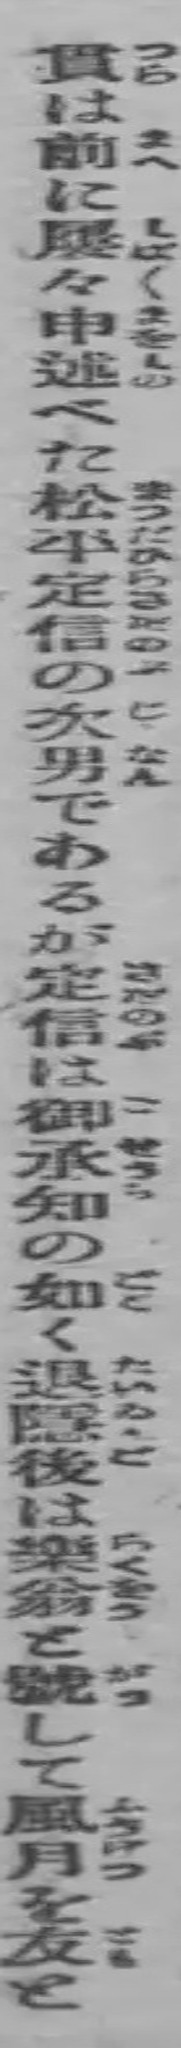貫は前に屡々申述べた松平定信の次男であるが定信は御承知の如く退隠後は楽翁と号して風月を友と
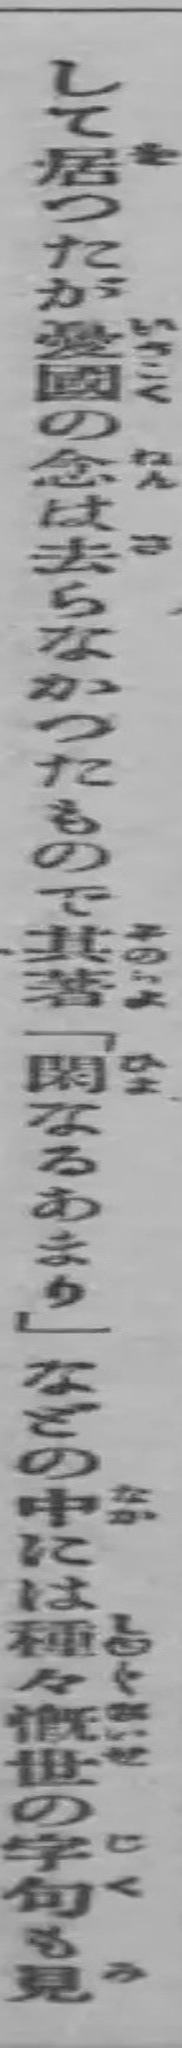して居つたが憂国の念は去らなかつたもので其著「閑なるあまり」などの中には種々概世の字句も見
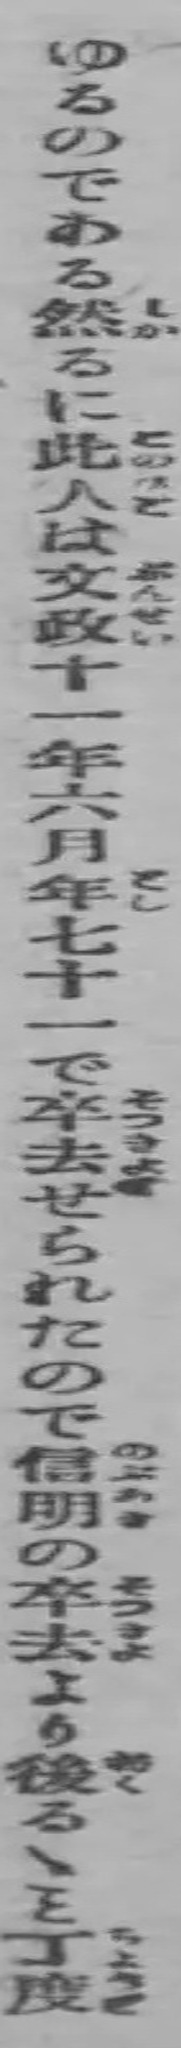ゆるのである然るに此人は文政十一年六月年七十一で卒去せられたので信明の卒去よりも後るゝこと丁度
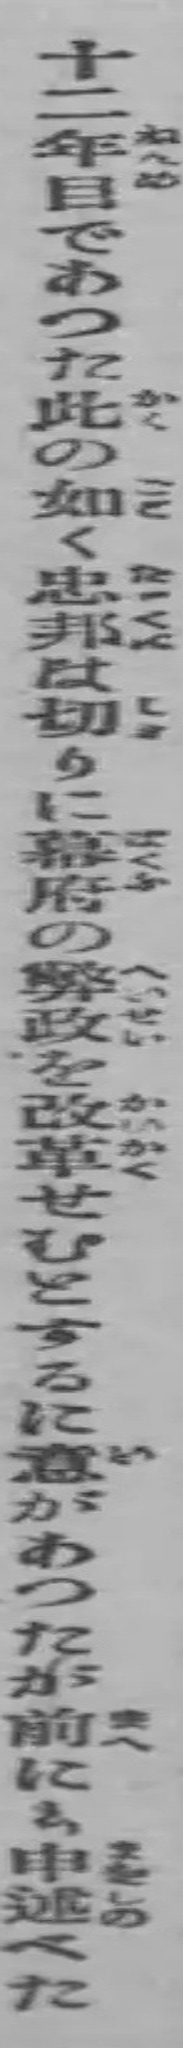十二年目であつた此の如く忠邦は切りに幕府の弊政を改革せむとするに意があつたが前にも申述べた
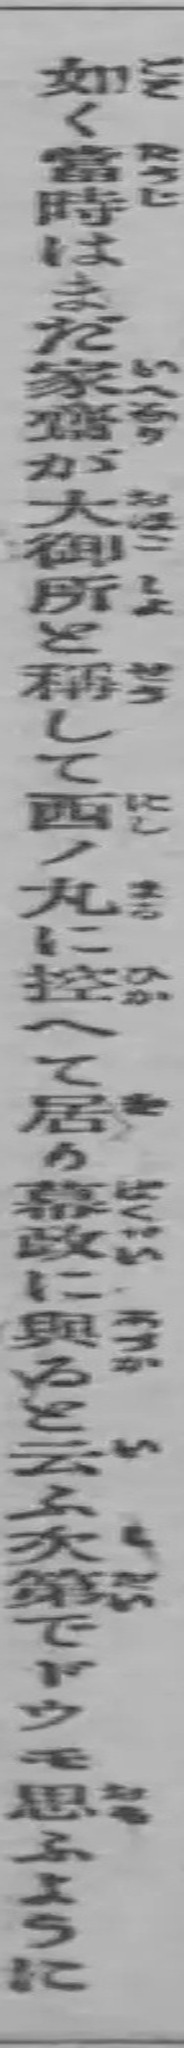如く当時はまだ家斉が大御所と称して西ノ丸に控へて居り幕政に与ると云ふ次第でドウモ思ふように
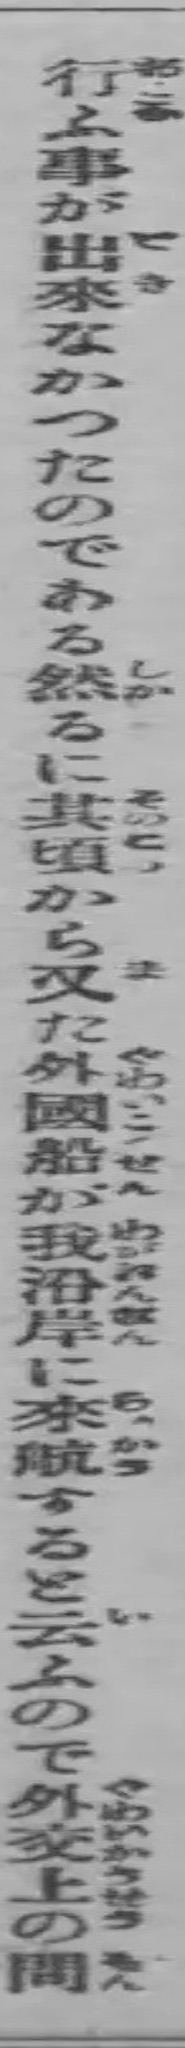行ふ事が出来なかつたのである然るに其頃から又た外国船が我沿岸に来航すると云ふので外交上の問
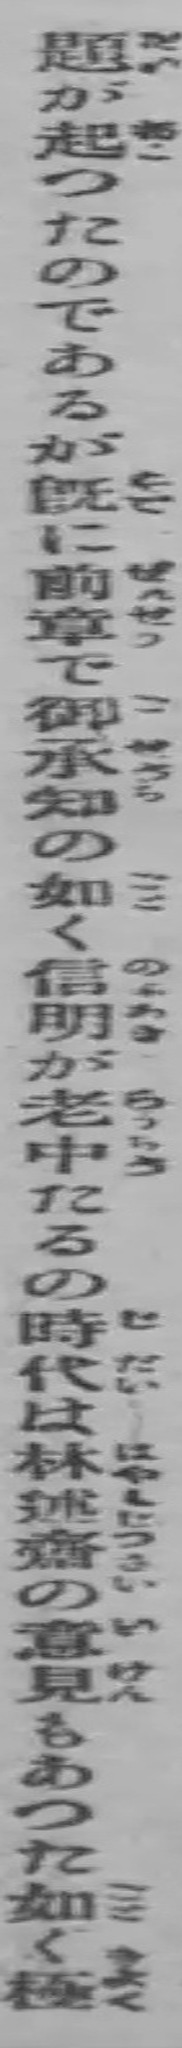題が起つたのであるが既に前章で御承知の如く信明が老中たるの時代林述斉の意見もあつた如く極
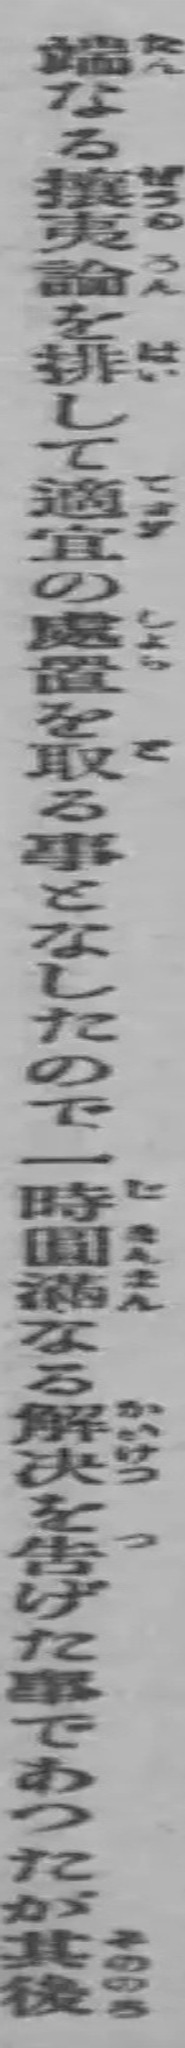端なる攘夷論を排して適宜の処置を取る事となしたので一時円満なる解決を告げた事であつたが其後
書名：豊橋市史談
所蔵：国立国会図書館 National Diet Library, JAPAN
